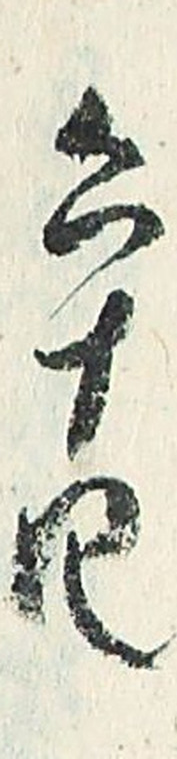六十四
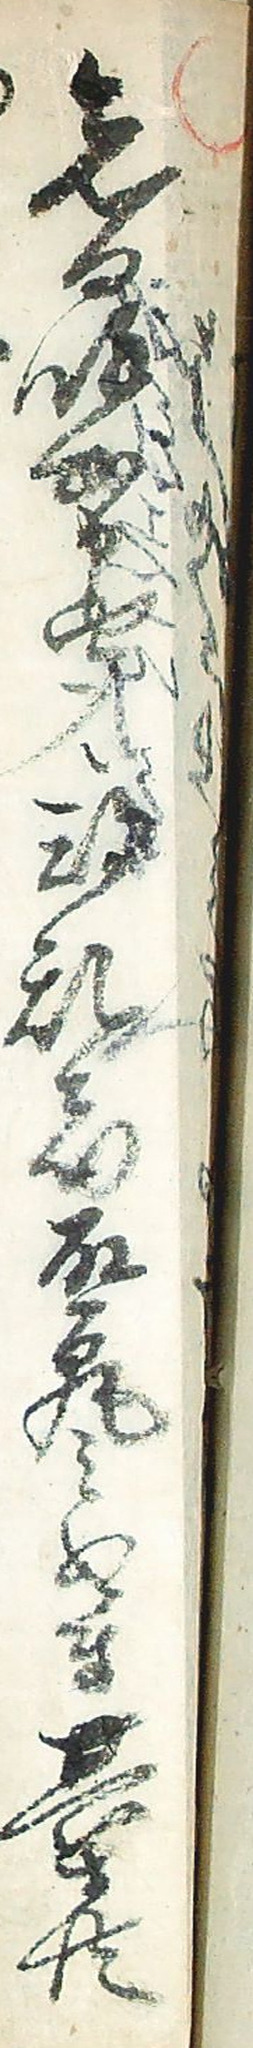先日呼出申聞候胡乱者取究之義ニ付其方共
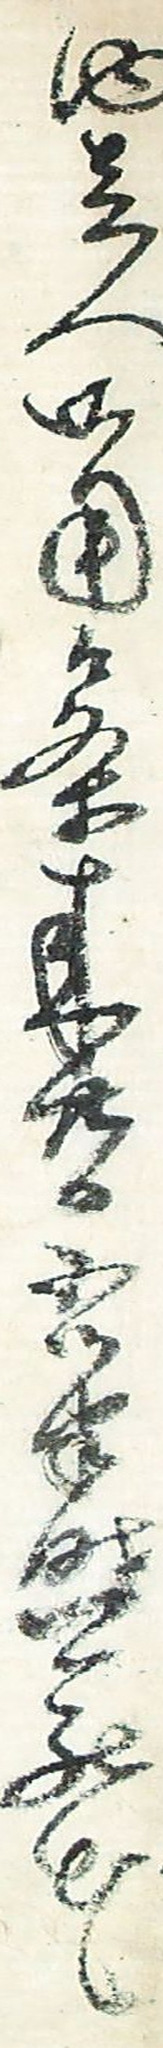内壱人御用候条来廿日五ツ半時可罷出候
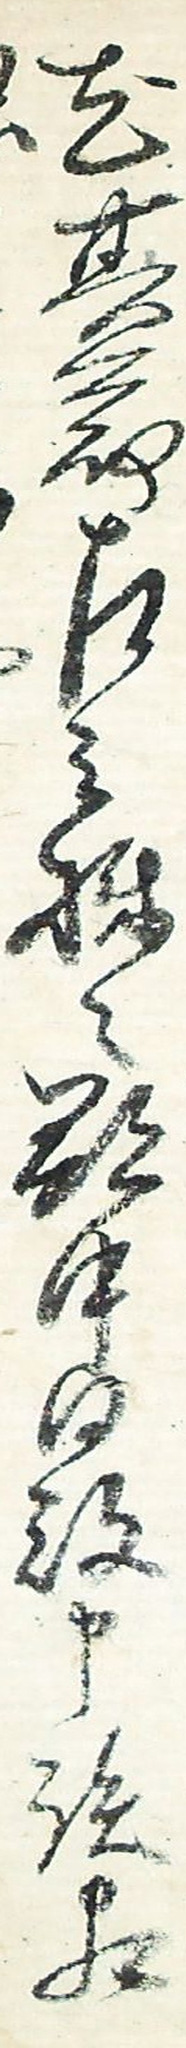尤其節左之株々郡中同役申談相
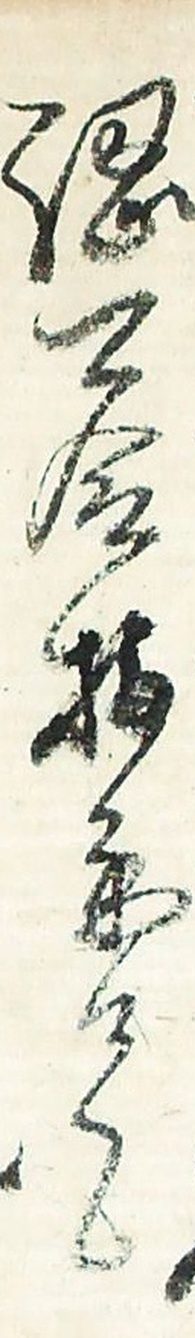認可令指出候以上
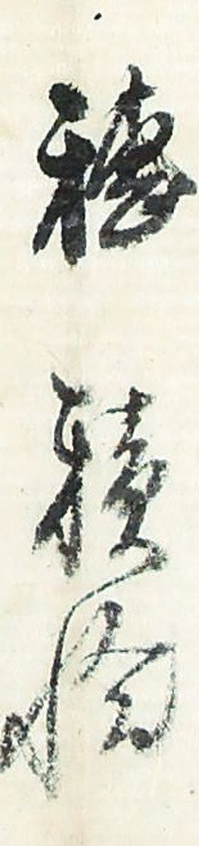穂積恰
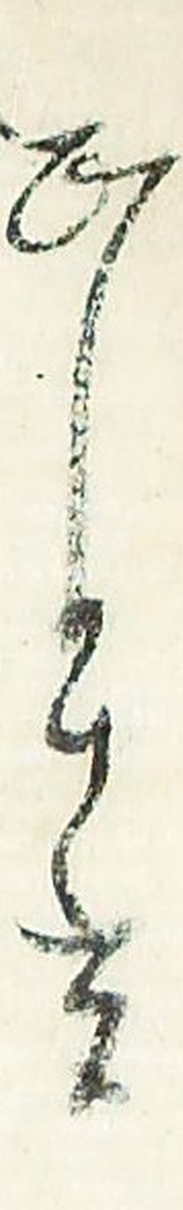正月十六日
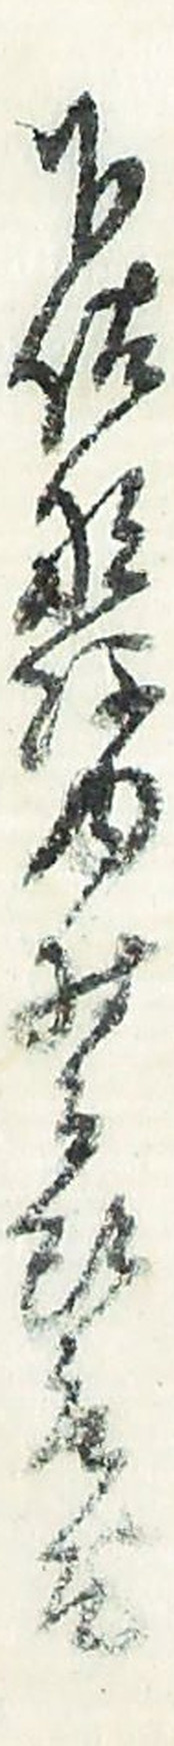下佐那河内村与頭庄屋
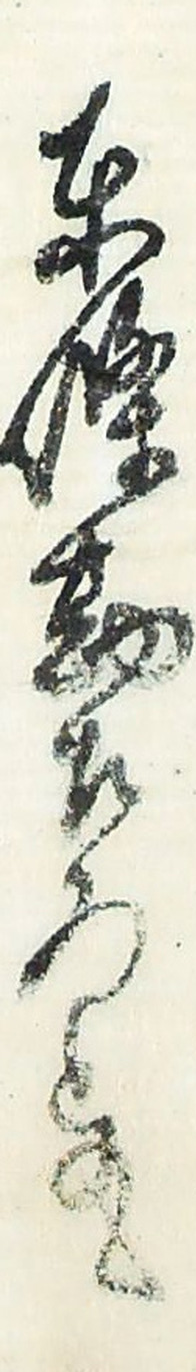東條勘左衛門とのへ
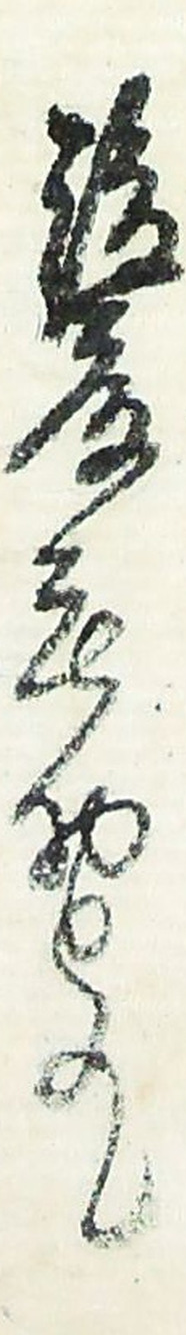後藤庄助とのへ
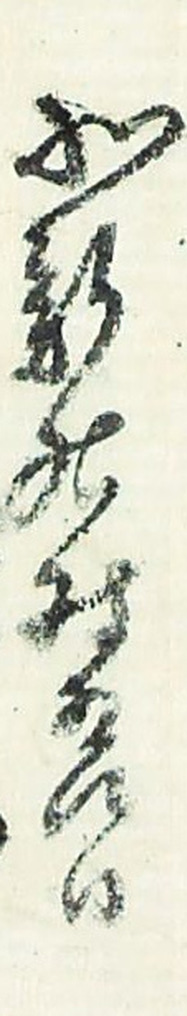北新居村右同
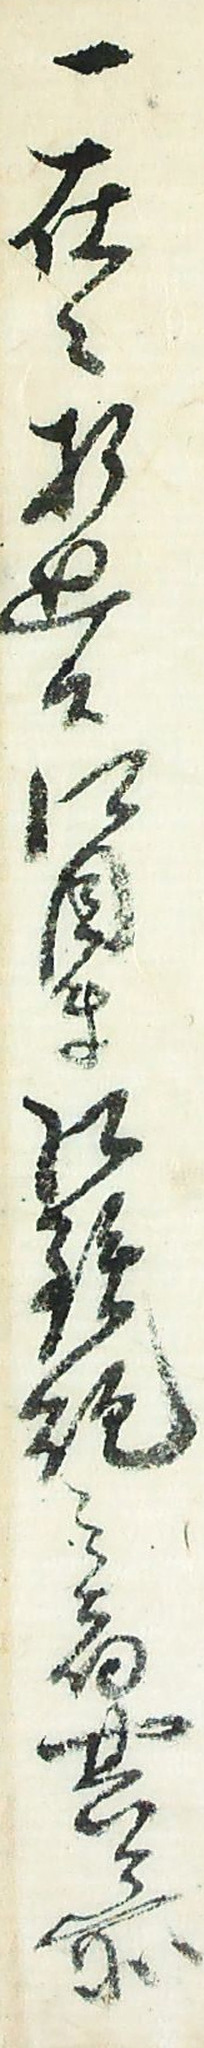一在々打廻候郷目付郷鉄砲之者其ヶ所
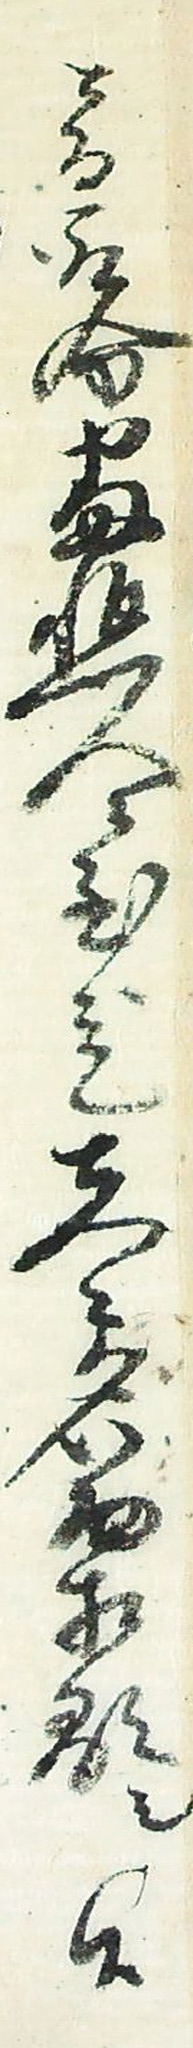ニ而取分番非人ニ至迄夫々名面相顕シ候
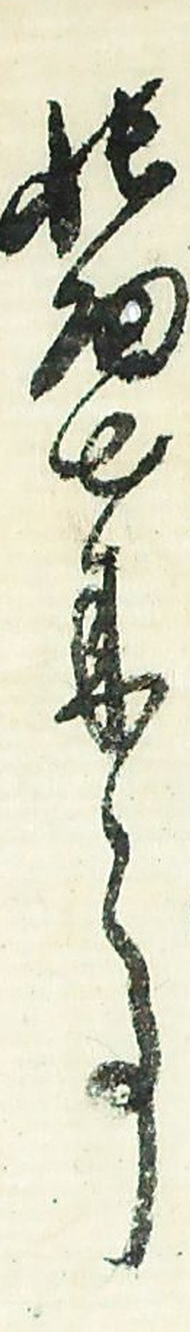帳面出来候事
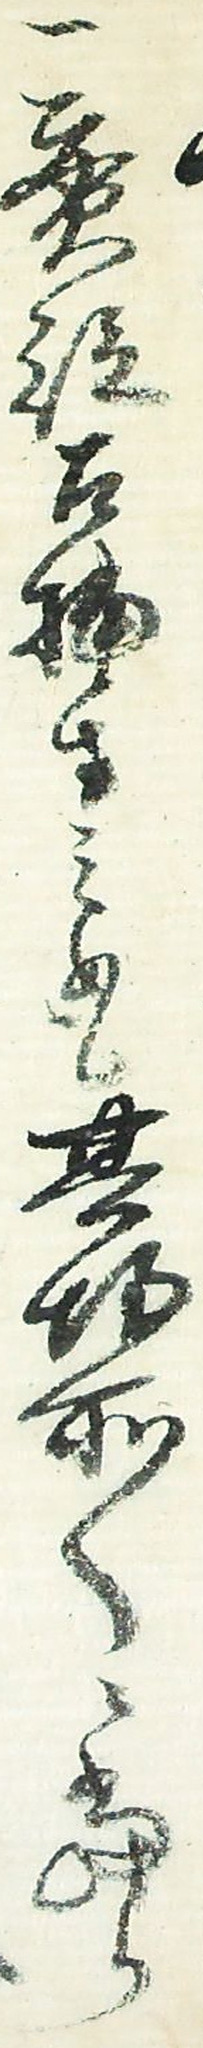一奕徒召捕方之義も其場所〳〵ニ當り
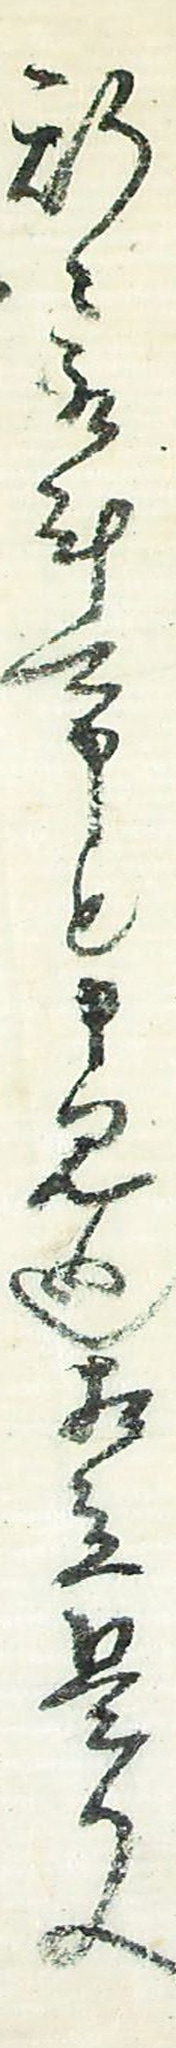斯々取計可申と申見廻込相立是又
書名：諸御趣意書并御下知向之写
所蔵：鳴門教育大学 Naruto University of Education
